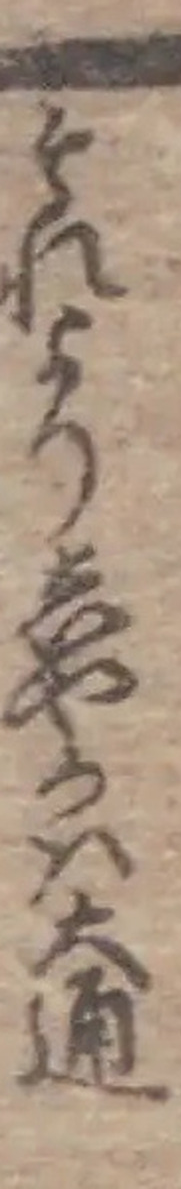それよりしやかは大通
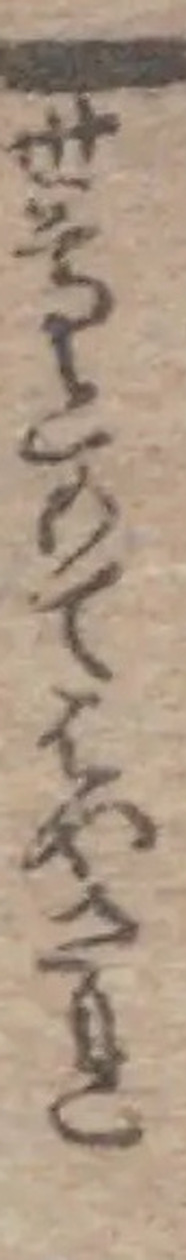世尊ともてはやされ
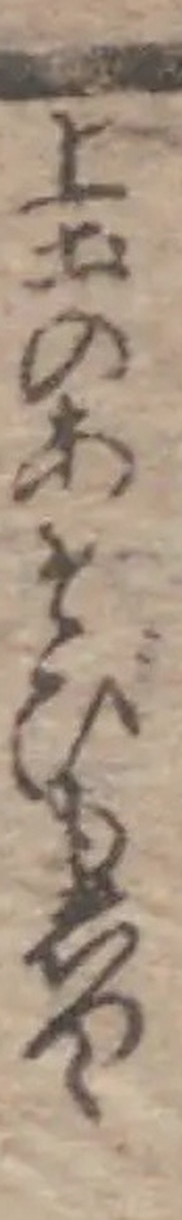上土のあそびもしつく
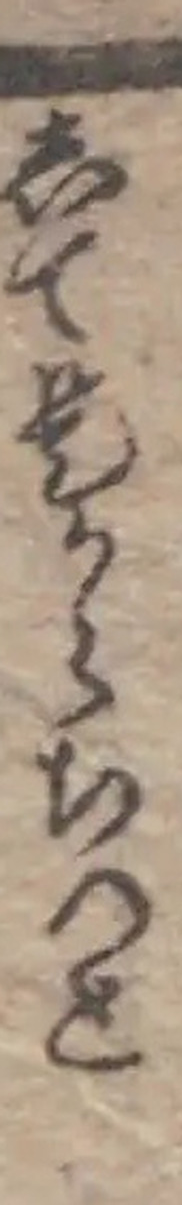して是からちつと
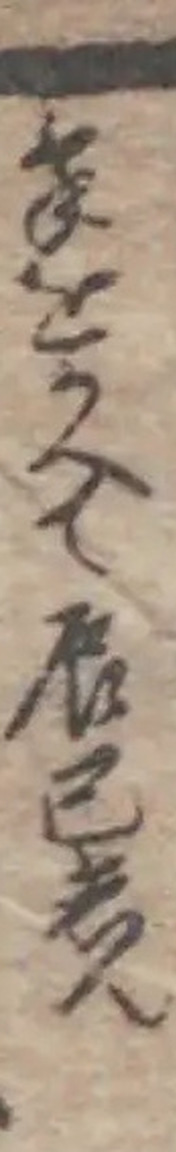気をかへて辰巳しん
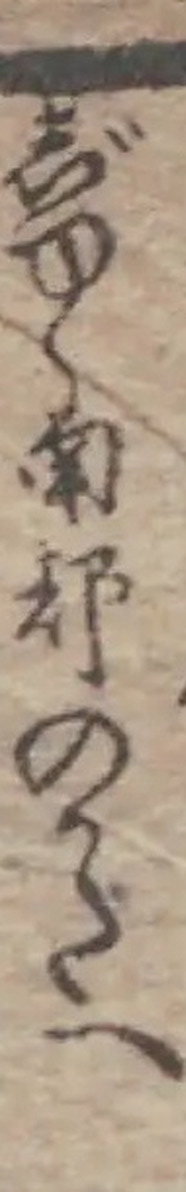じゆく南部の方へ
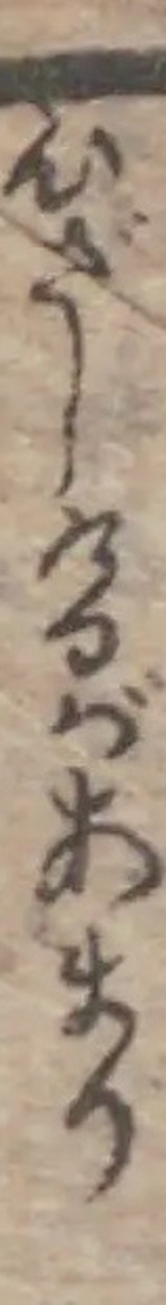心ざしけるがあまり
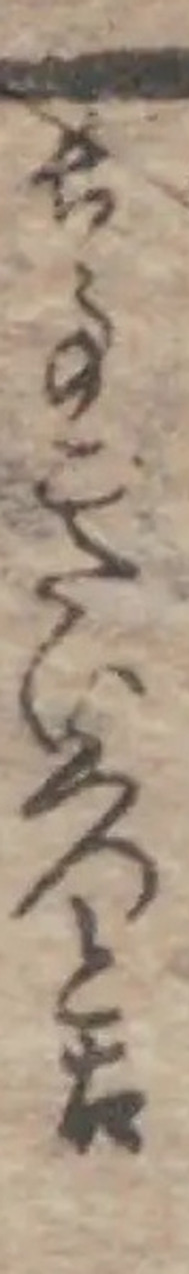長事こたいくつと右
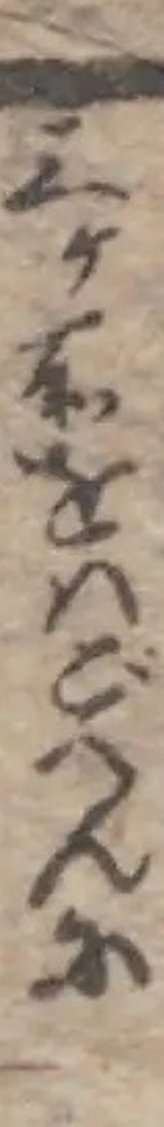三ヶ所をはごへんに
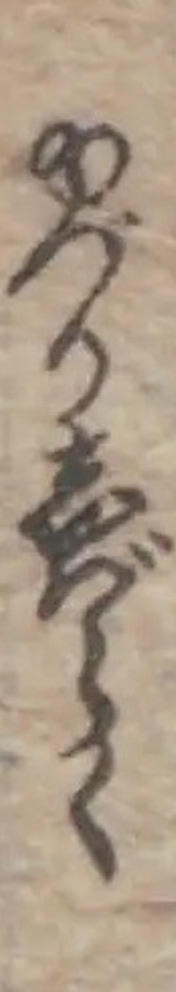ゆづりしばらく
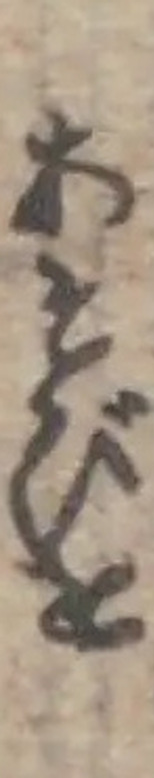あそびを
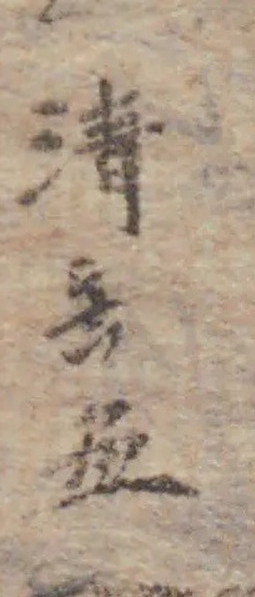清長画
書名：早出来 3巻
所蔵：国立国会図書館 National Diet Library, JAPAN
